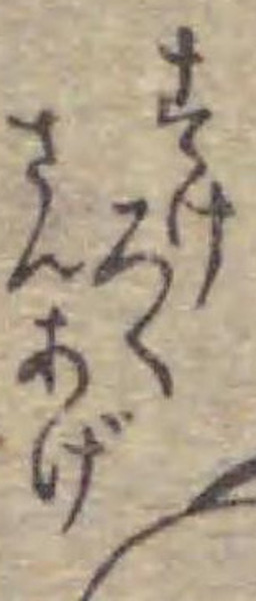さんあげ
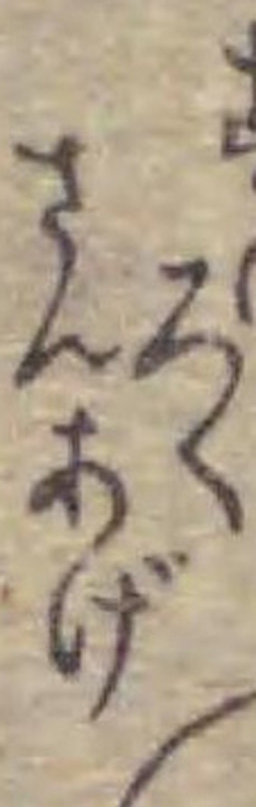さんあげ
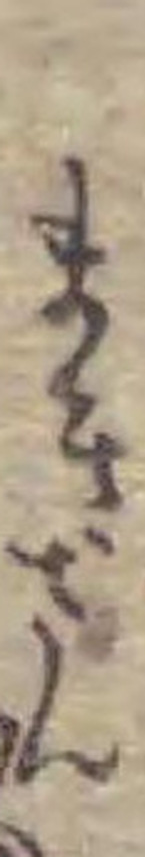まきさん
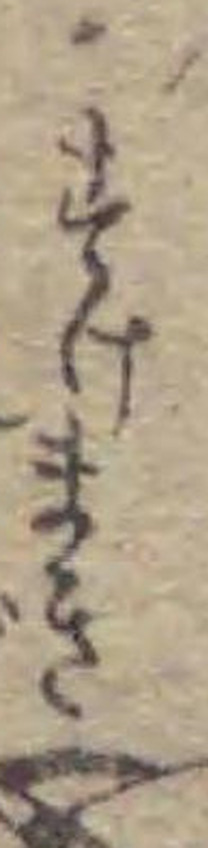すけまき
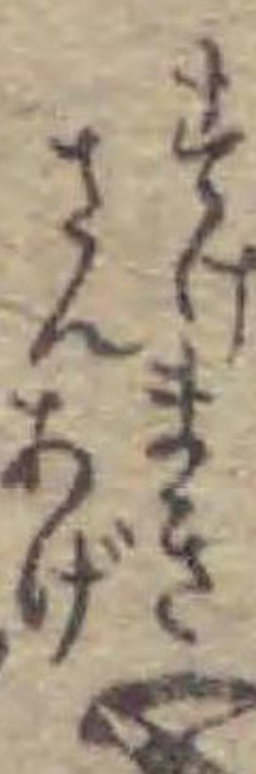さんあげ
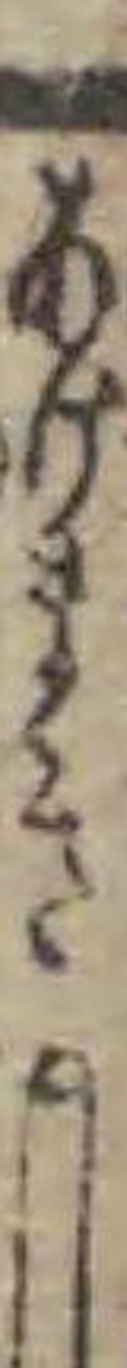すけまき
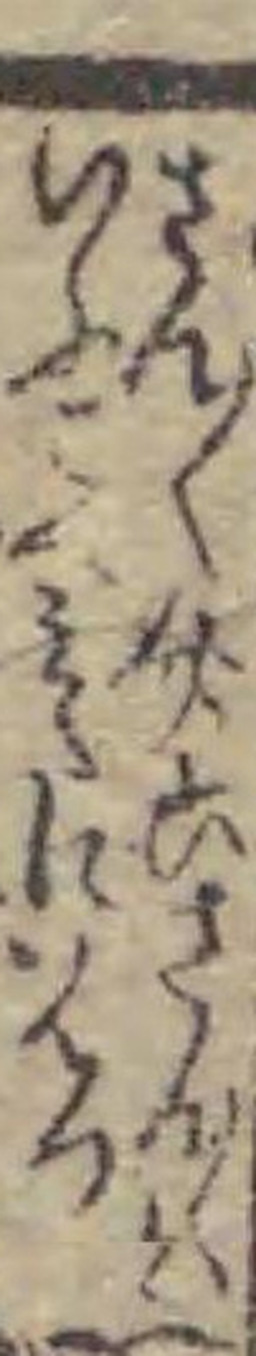いふこへみゝにいくつ
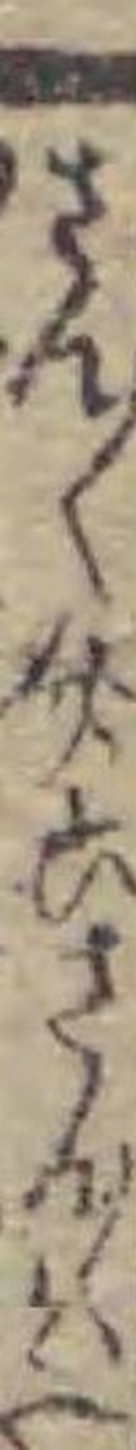さん〳〵介六さん〳〵と
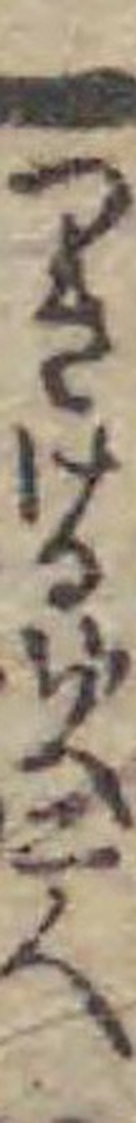つきけるゆへ二人
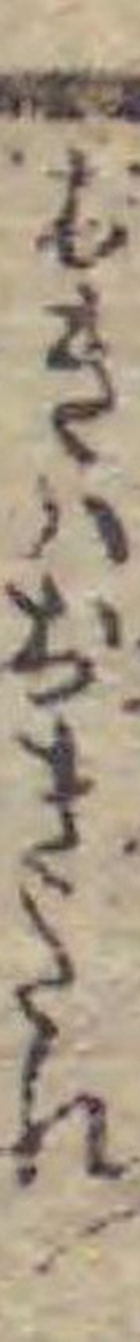おきはおきたれ
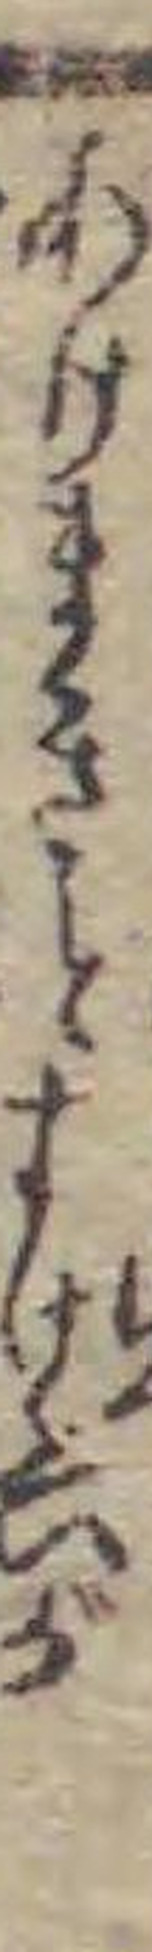あけまきとすけ六が
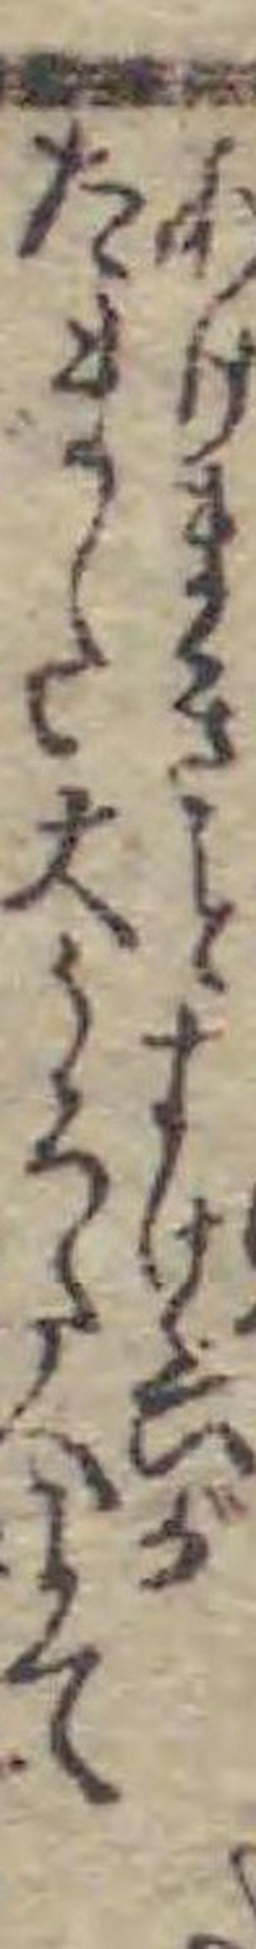たましい大うろたへにて
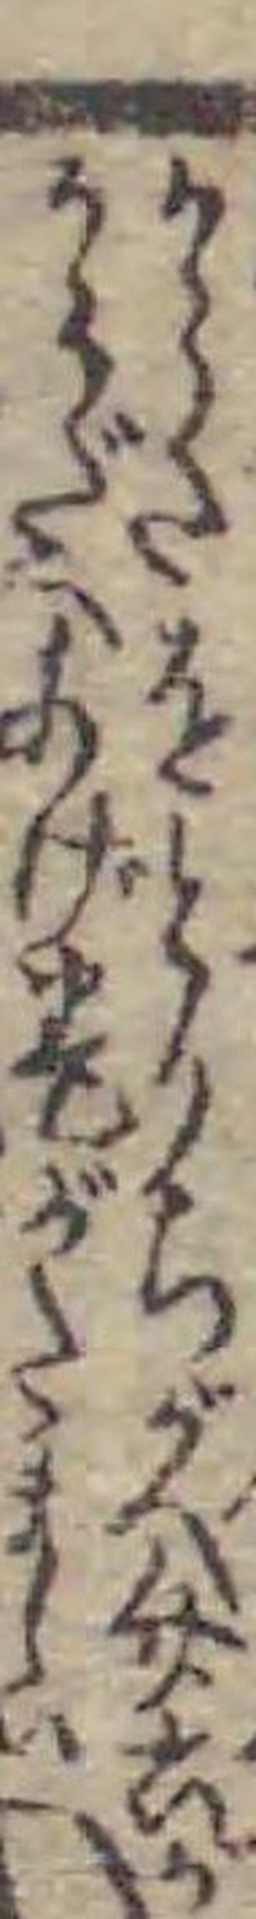からだへあげ巻がたましい
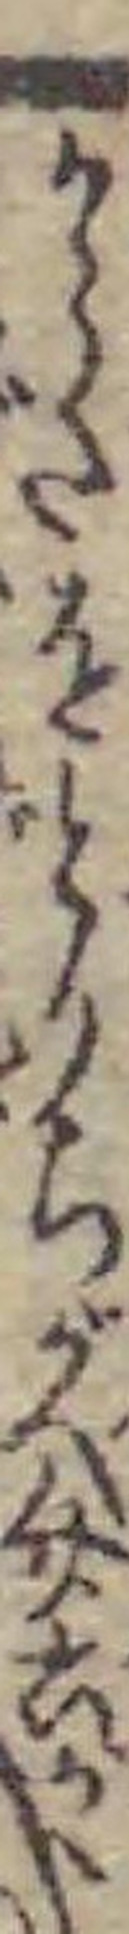からだをとりちがへ介六が
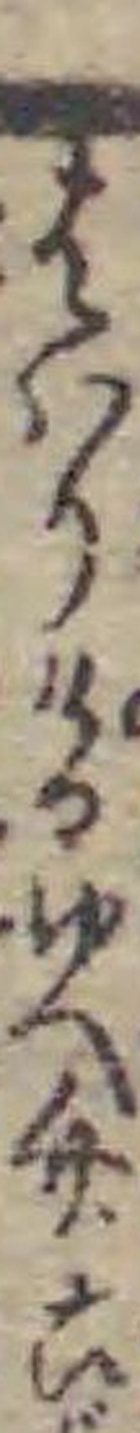はいりけるゆへ介六が
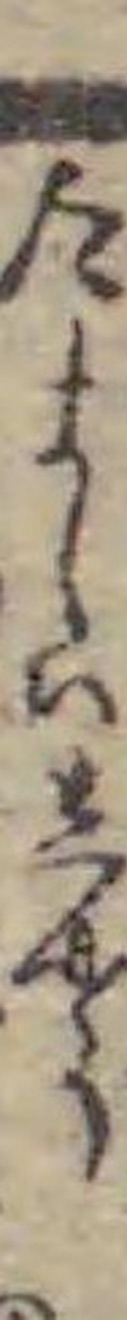たましいしやう
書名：江戸花俳優贔屓 : 3巻
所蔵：国立国会図書館 National Diet Library, JAPAN
